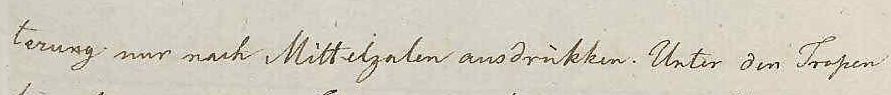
terung nur nach Mittelzalen ausdrükken. Unter den Tropen
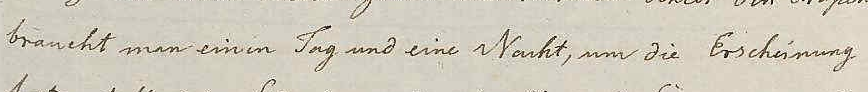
braucht man einen Tag und eine Nacht, um die Erscheinung
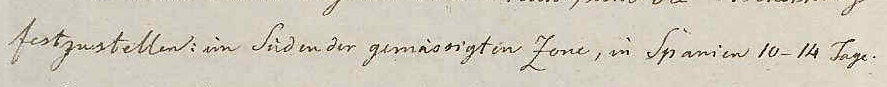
festzustellen: im Süden der gemässigten Zone, in Spanien 10–14 Tage
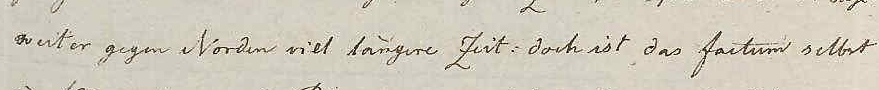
weiter gegen Norden viel längere Zeit: doch ist das factum selbst
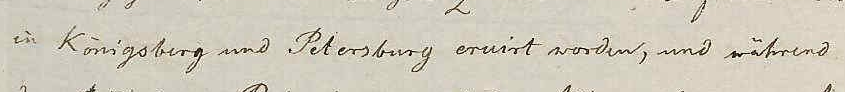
in Königsberg und Petersburg eruirt worden, und während
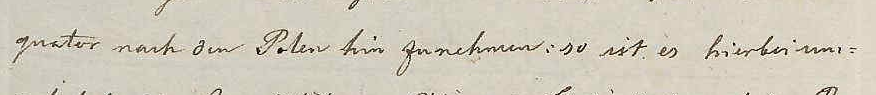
quator nach den Polen hin zunehmen: so ist es hierbei um-
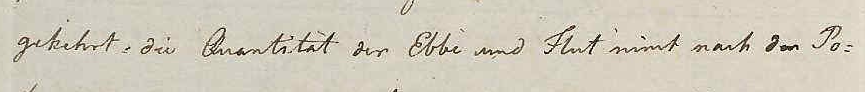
gekehrt: die Quantität der Ebbe und Flut nimt nach den Po-
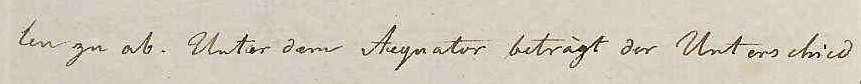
len zu ab. Unter dem Aequator beträgt der Unterschied
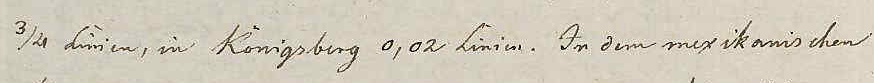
¾ Linien, in Königsberg 0,02 Linien. In dem mexikanischen
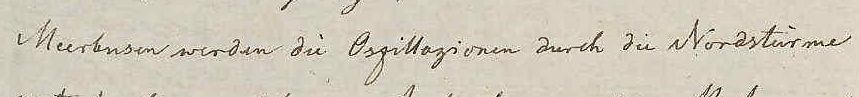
Meerbusen werden die Oszillazionen durch die Nordstürme
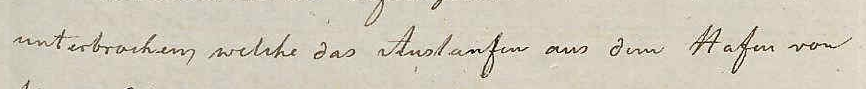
unterbrochen, welche das Auslaufen aus dem Hafen von
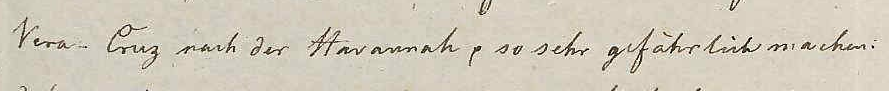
Vera-Cruz nach der Havannah p so sehr gefährlich machen:
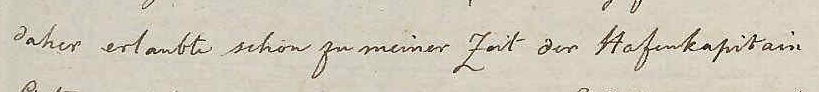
daher erlaubte schon zu meiner Zeit der Hafenkapitain
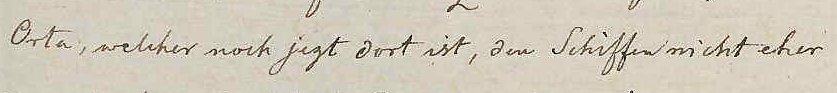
Orta, welcher noch jezt dort ist, den Schiffen nicht eher
